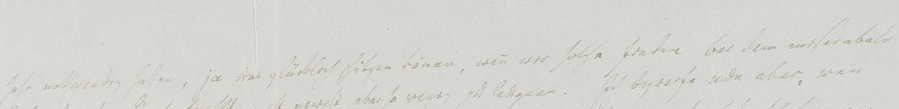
sehr nothwendig haben, ja uns glücklich schätzen können, wenn wir solche finden bei dem miserabeln
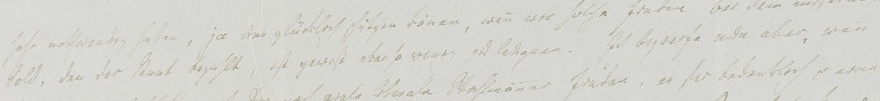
Sold, den der Staat bezahlt, ist gewiß ebenso wenig zu leugnen. Ich begreife nun aber, wenn
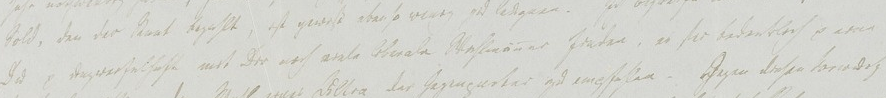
Du & unzweifelhaft mit Dir noch viele liberale Wahlmänner finden, es sei bedenklich & eine
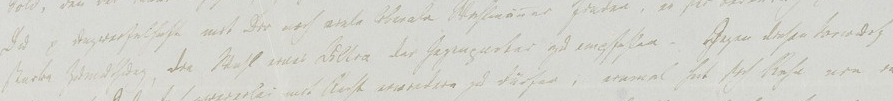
starke Zumuthung, die Wahl eines Ultra der Gegenpartei zu empfehlen. Gegen diesen Vorwurf
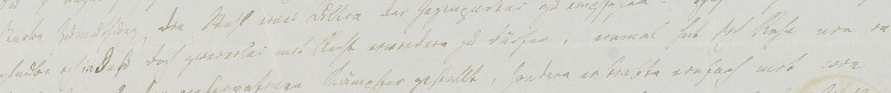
glaube ich indeß doch zweierlei mit Recht erwiedern zu dürfen; einmal hat sich Rahn nie in
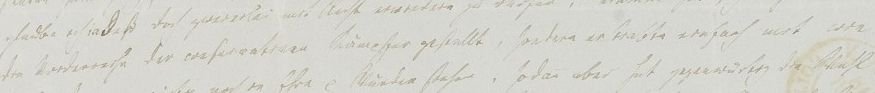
die Vorderreihe der conservativen Kämpfer gestellt, sondern er trabte einfach mit wie
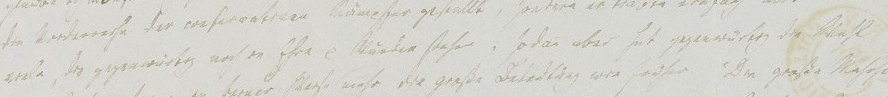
viele, die gegenwärtig noch in Ehre & Würden stehen; sodann aber hat gegenwärtig die Wahl
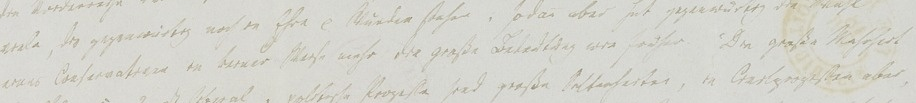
eines Conservativen in keiner Weise mehr die große Bedeutung wie früher. Die große Mehrheit
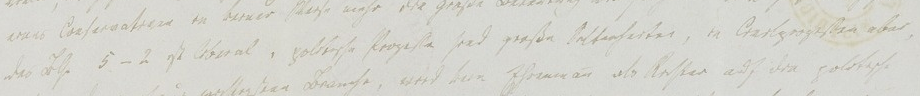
des BG. 5-2 ist liberal, politische Prozesse sind große Seltenheiten, in Civilprocessen aber,
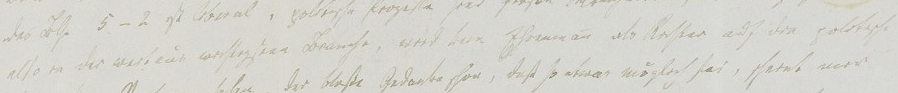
also in der weitaus wichtigsten Branche, wird kein Ehrenmann als Richter auf die politische
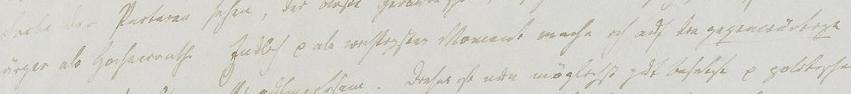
ärger als Hochverrath. Endlich & als wichtigstes Moment mache ich auf die gegenwärtige
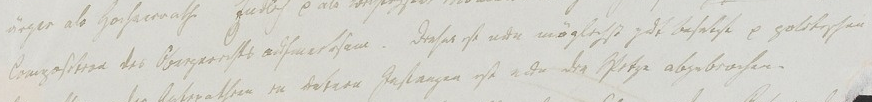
Composition des Obergerichts aufmerksam. Dieses ist nun möglichst gut besetzt & politischen
